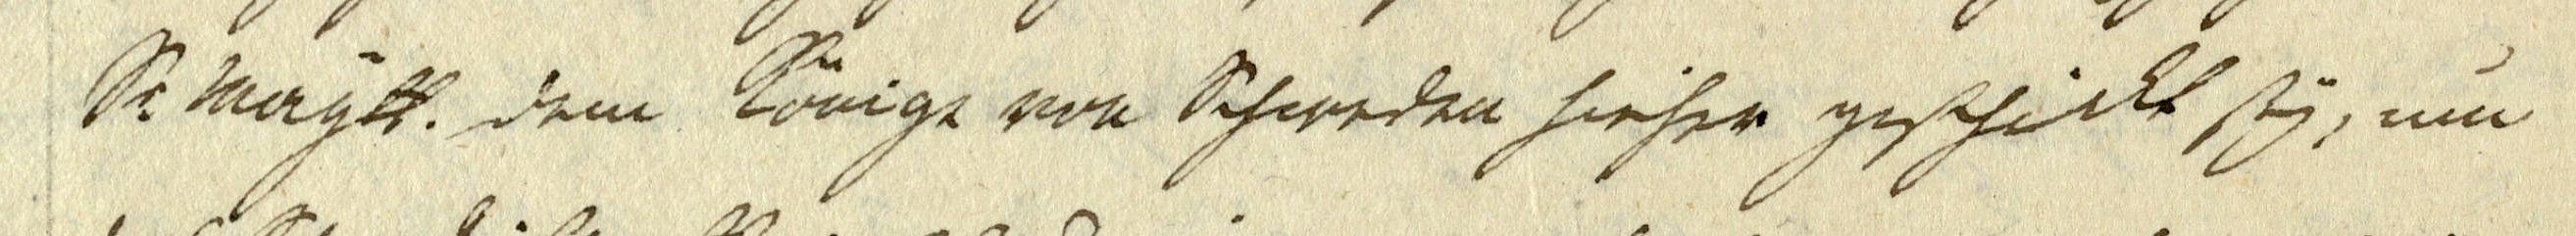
Sr Maÿtt. dem Könige von Schweden hieher geschickt seÿ, um
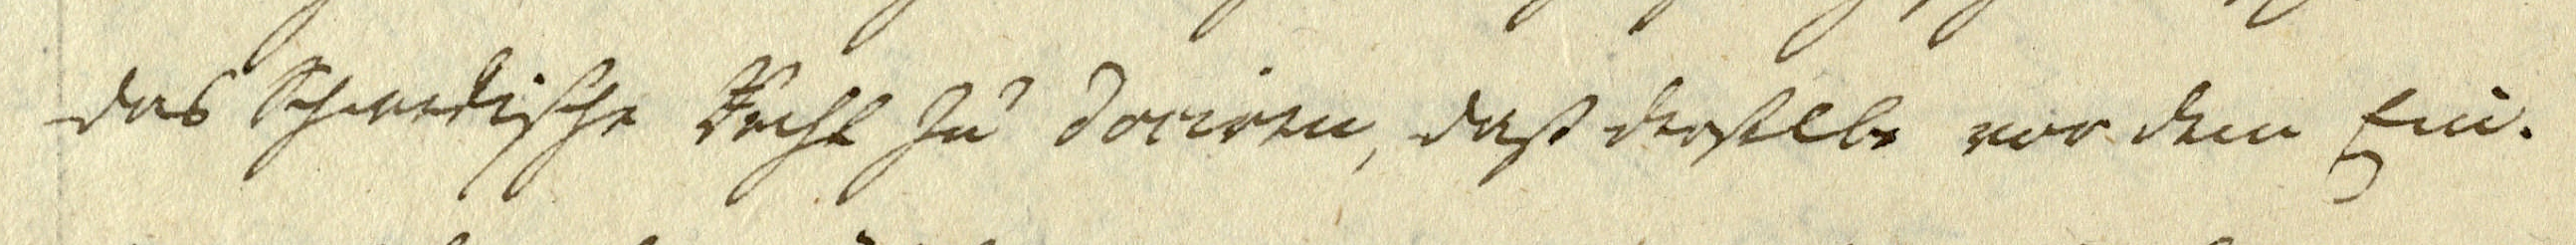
das Schwedische Recht zu dociren, daß derselbe vor dem Ein¬
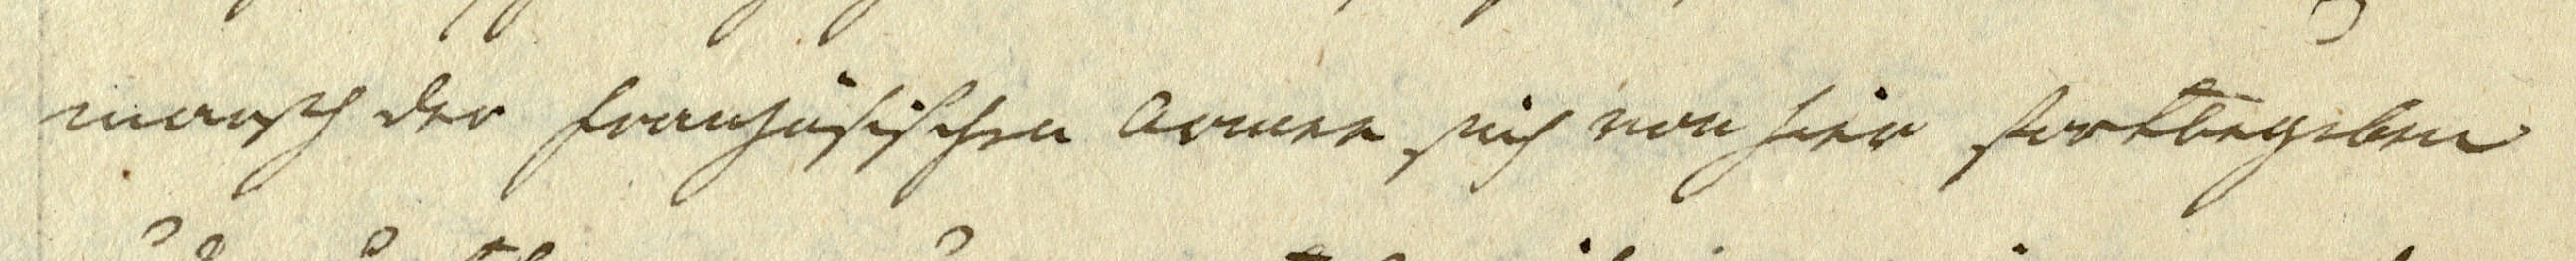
marsch der Französischen Armee sich von hier fortbegeben
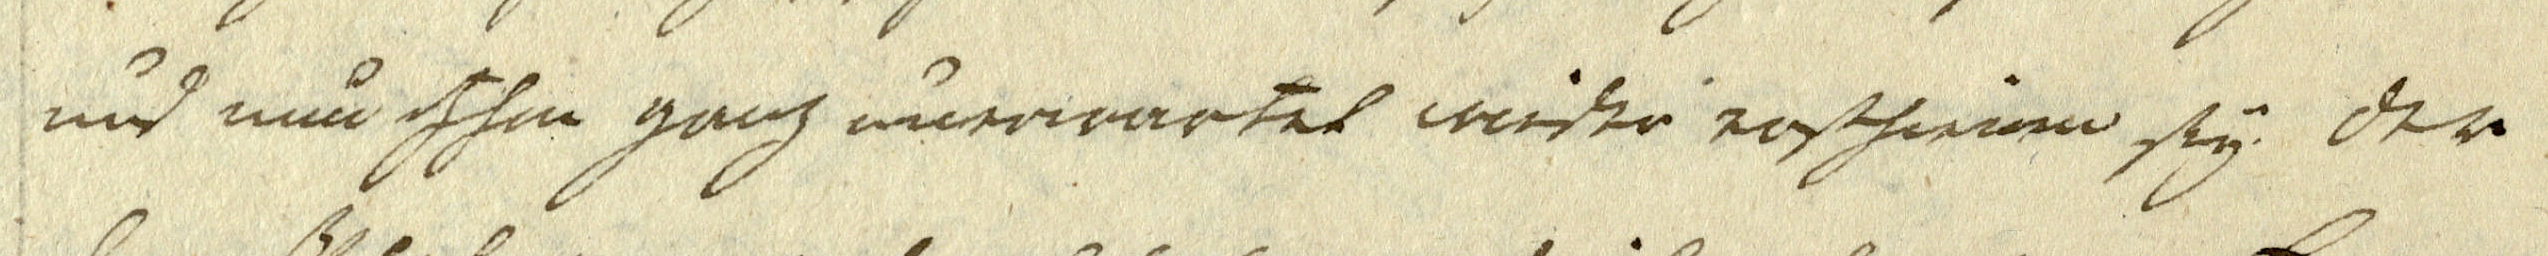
und nun Ihm ganz unerwartet wieder erschienen seÿ. Der
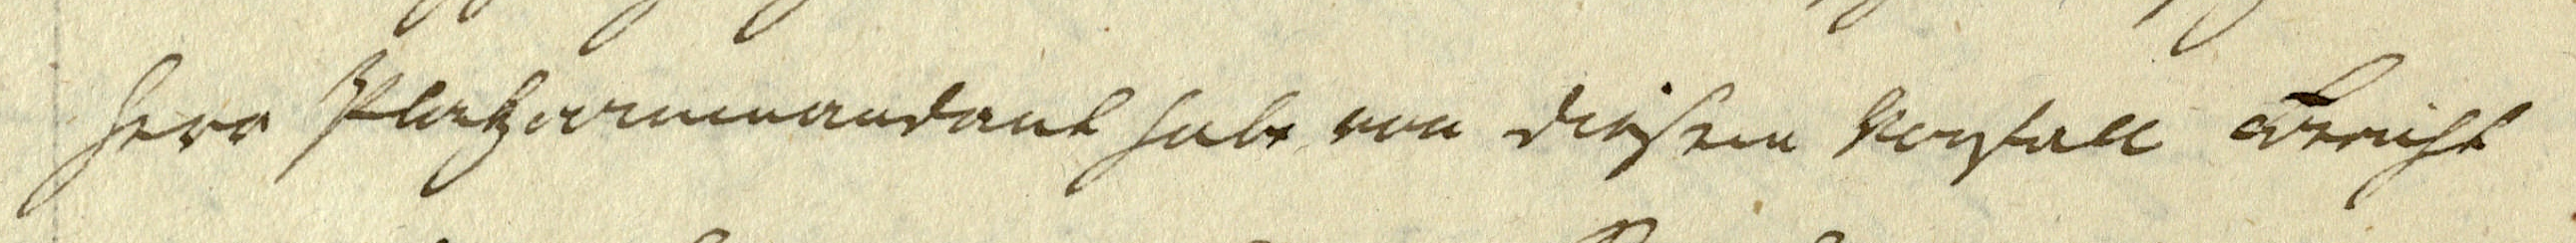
Herr Platzcommandant habe von diesem Vorfall Bericht
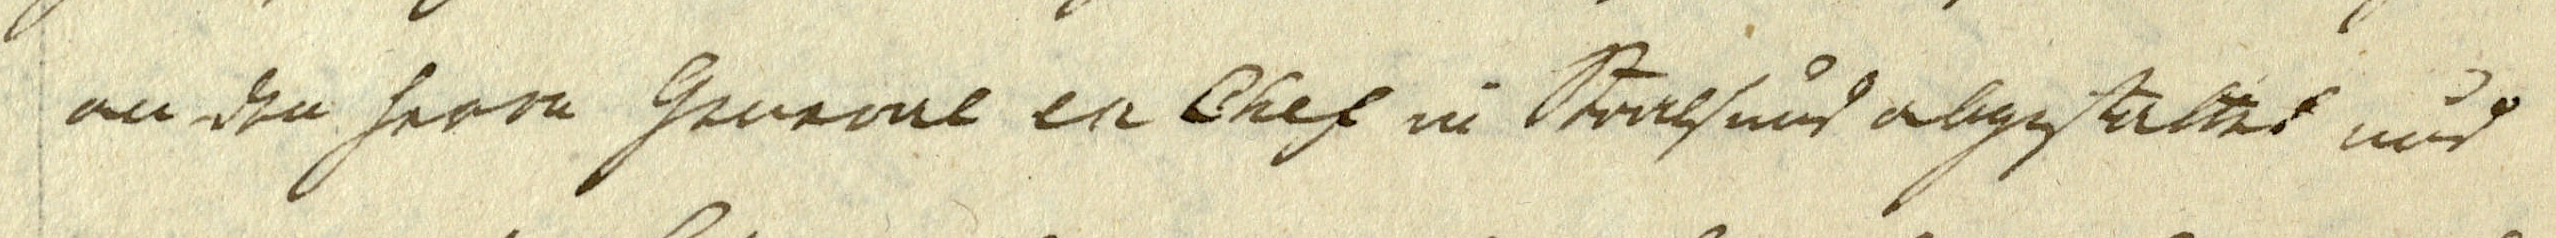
an den Herrn General en Chef in Stralsund abgestattet und
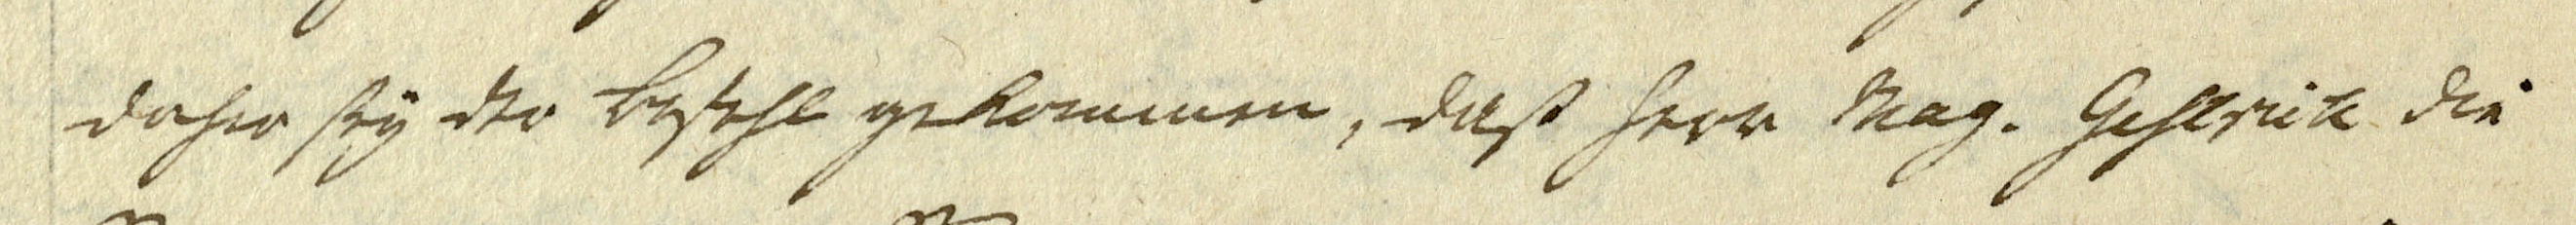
daher seÿ der Befehl gekommen, daß Herr Mag. Gestrich die
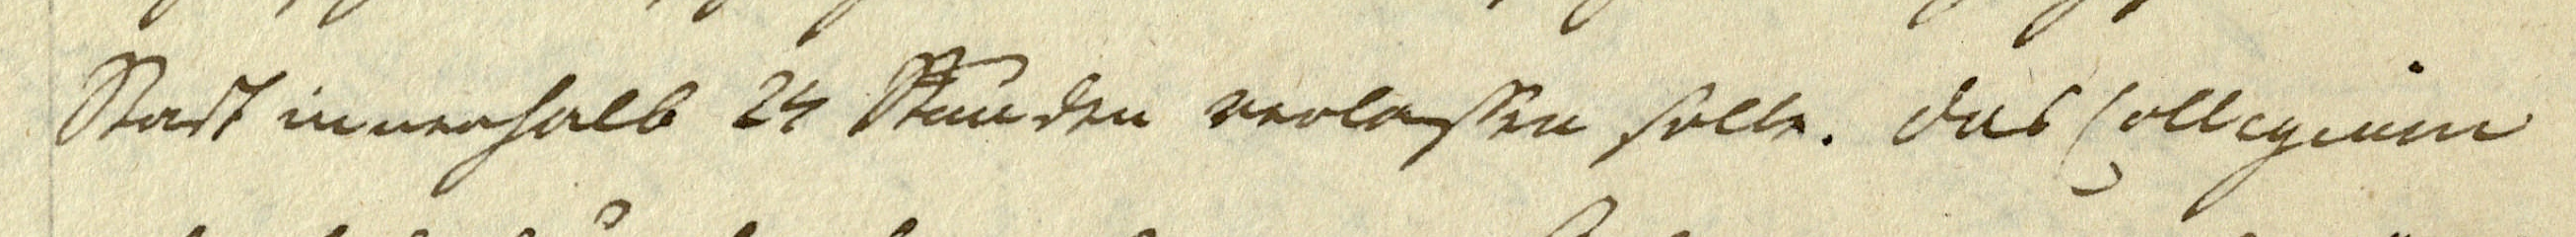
Stadt innerhalb 24 Stunden verlassen solle. Das Collegium
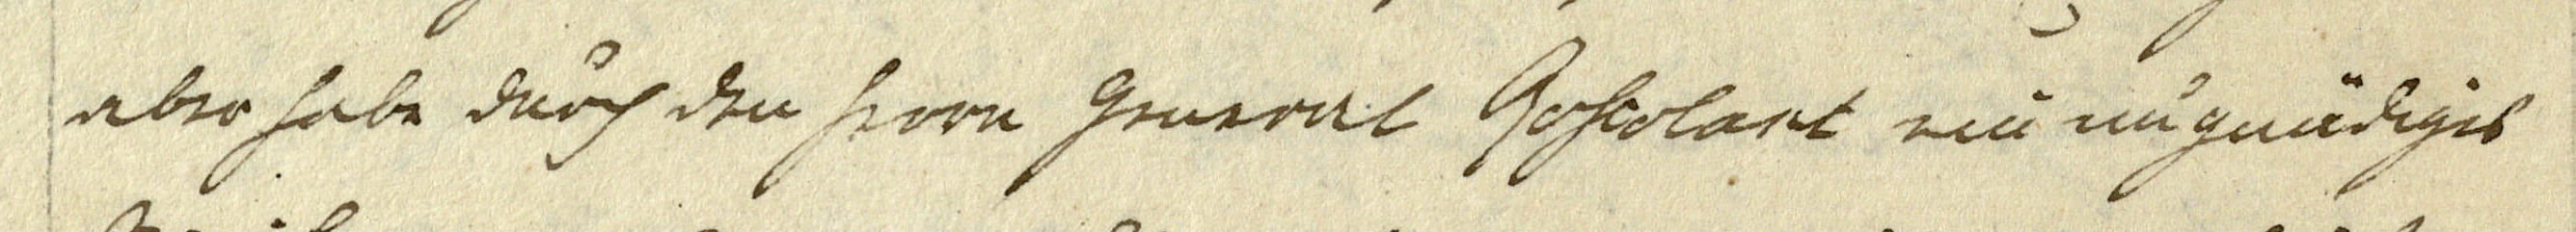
aber habe durch den Herrn General Roscolant ein ungnädiges
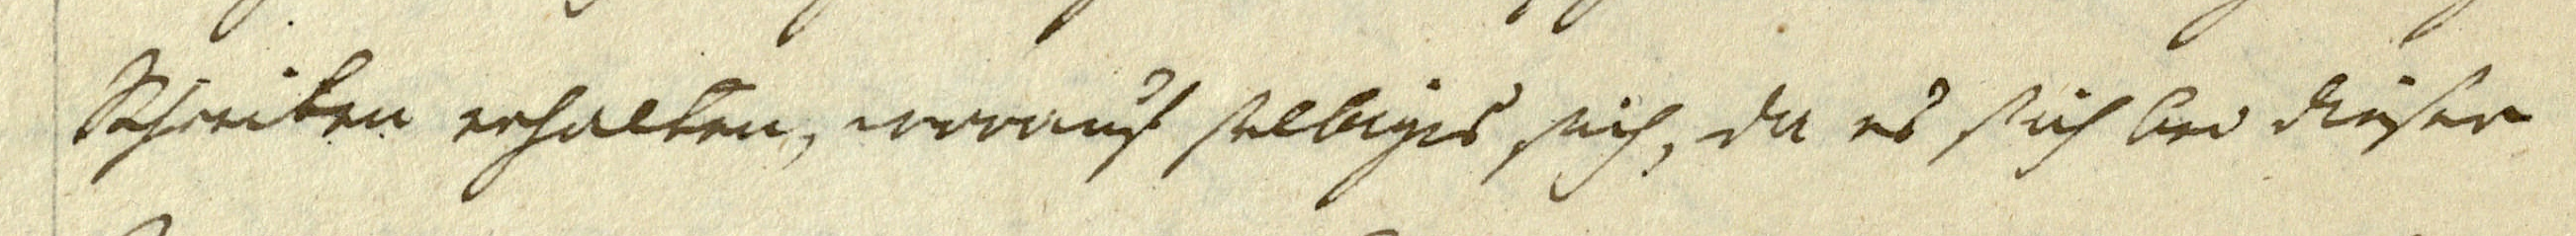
Schreiben erhalten, worauf selbiges sich, da es sich bei dieser
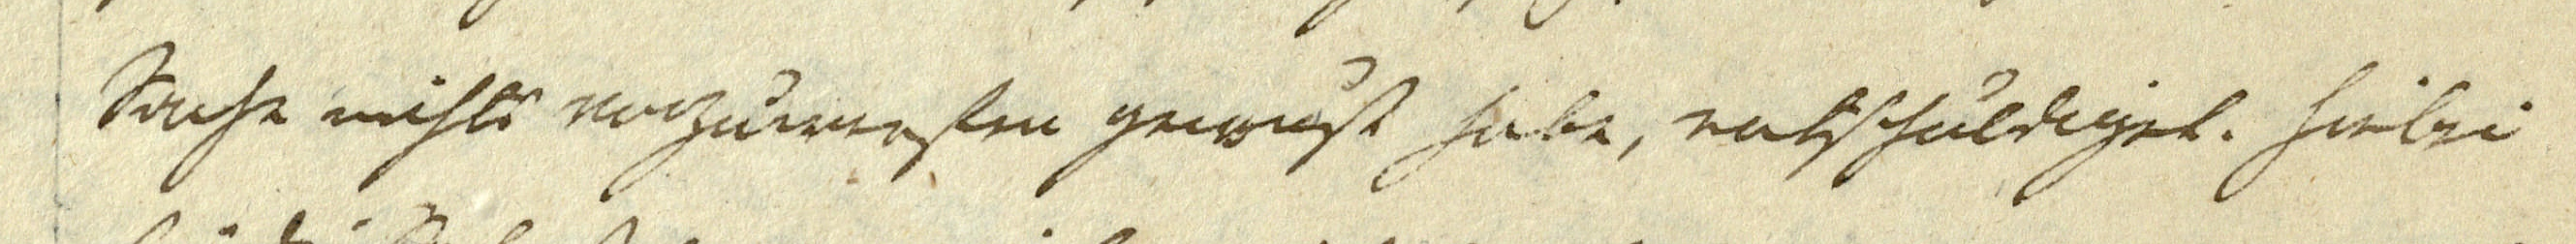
Sache nichts vonzuwerfen gewußt habe, entschuldiget. Hiebei
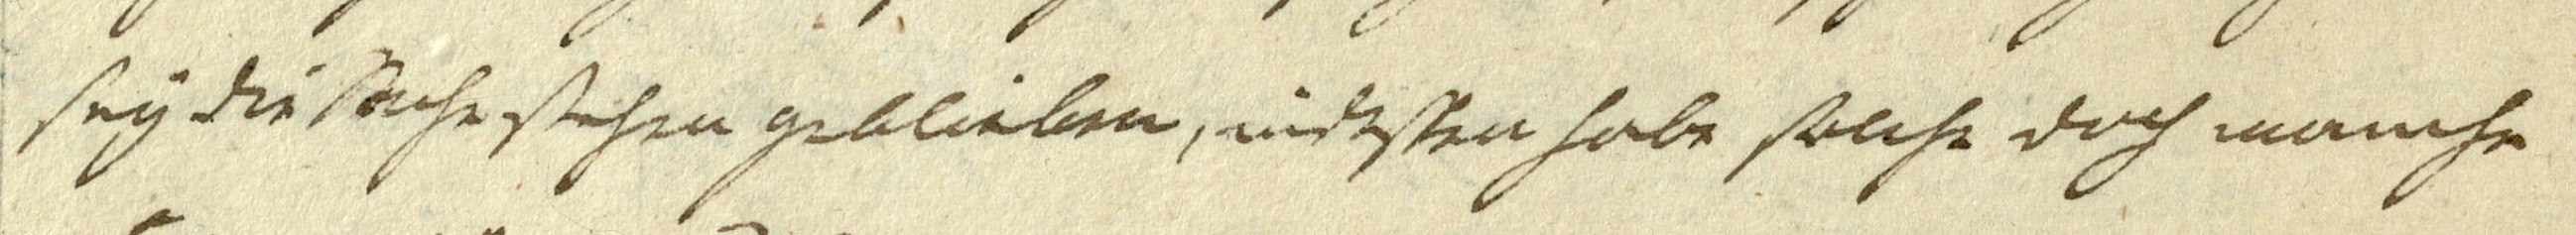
seÿ die Sache stehen geblieben, indessen habe solche doch manche
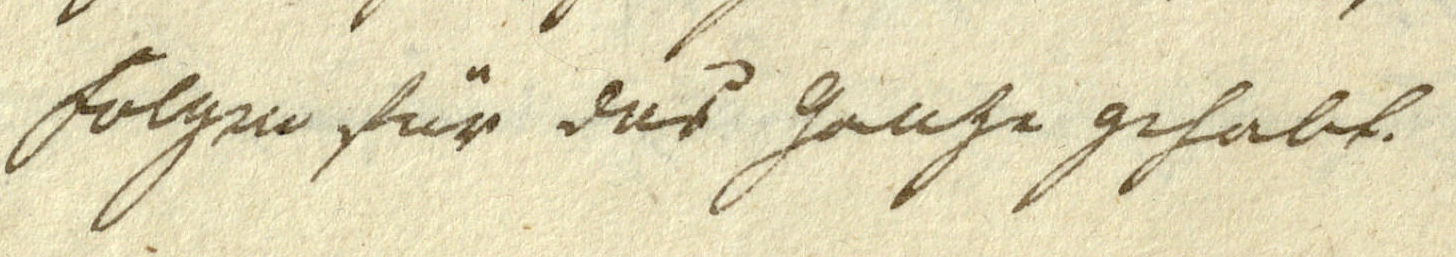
Folgen für das Ganze gehabt.
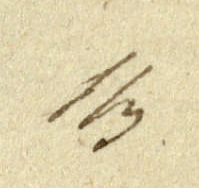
11.,
